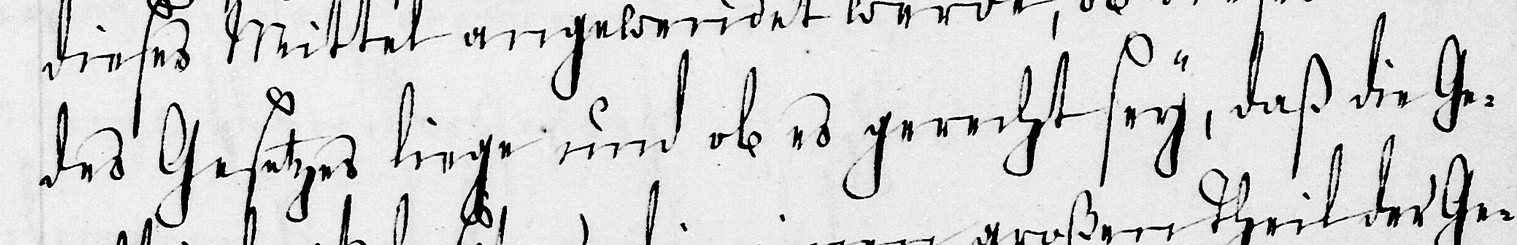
des Gesetzes liege und ob es gerecht sey, daß die Ge¬
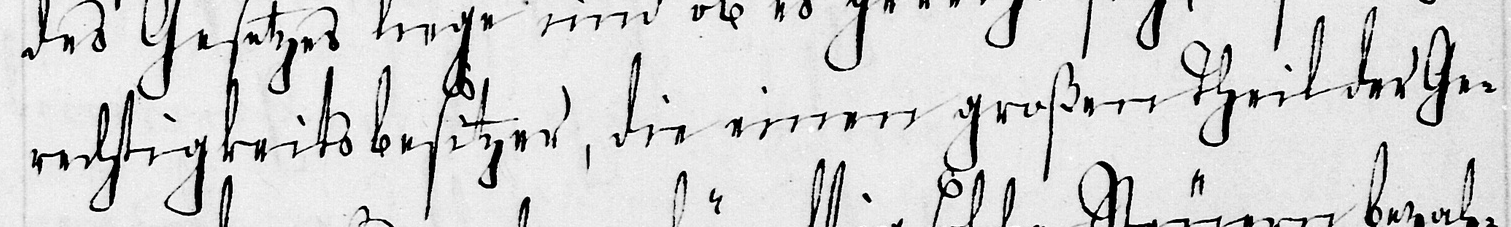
rechtigkeitsbesitzer, die einen großen Theil der Ge¬
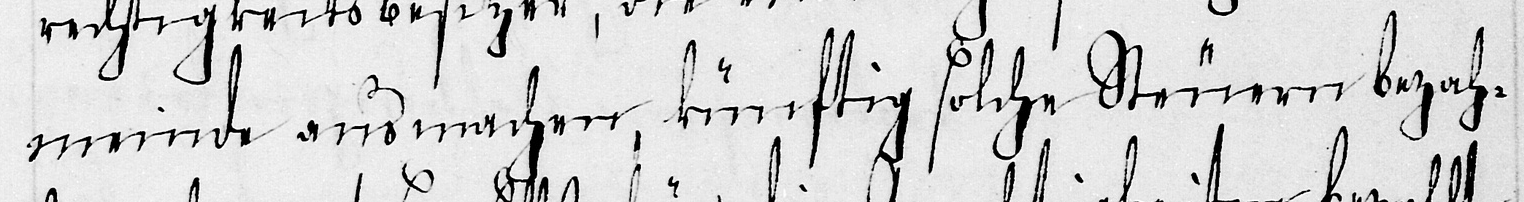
meinde ausmachen, künftig solche Steuern bezah¬
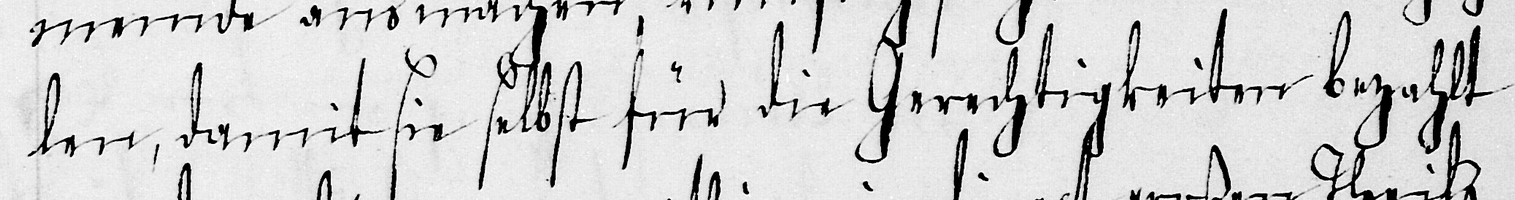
len, damit sie selbst für die Gerechtigkeiten bezahlt
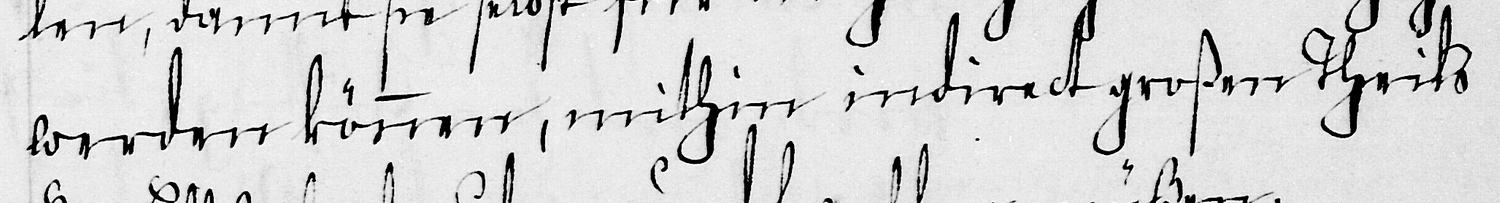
werden können, mithin indirect großen Theils
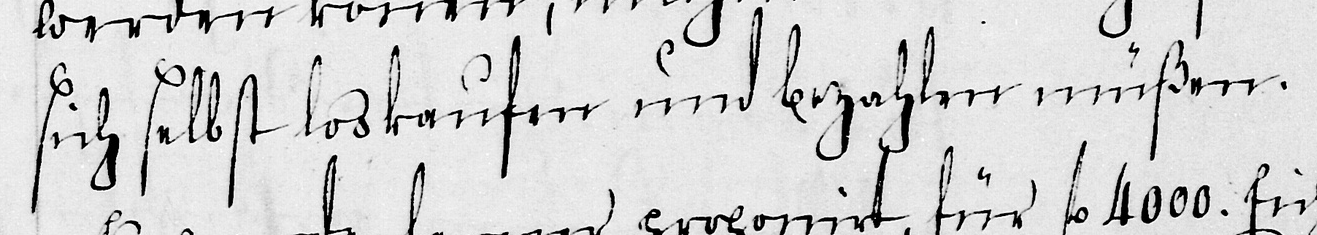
sich selbst loskaufen und bezahlen müßen.
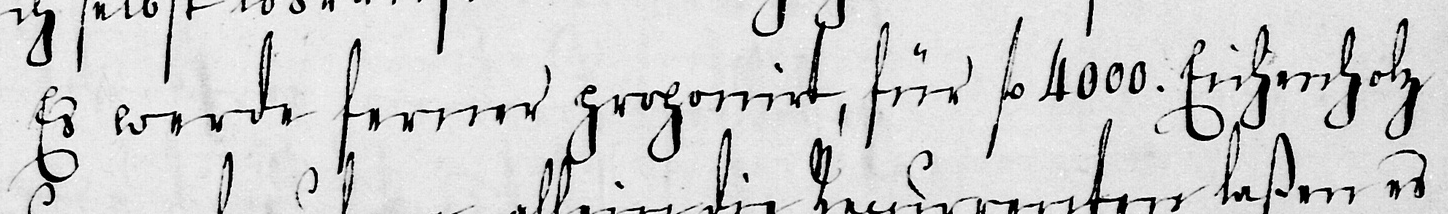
Es werde ferner proponirt, für fl. 4000. Eichenholz
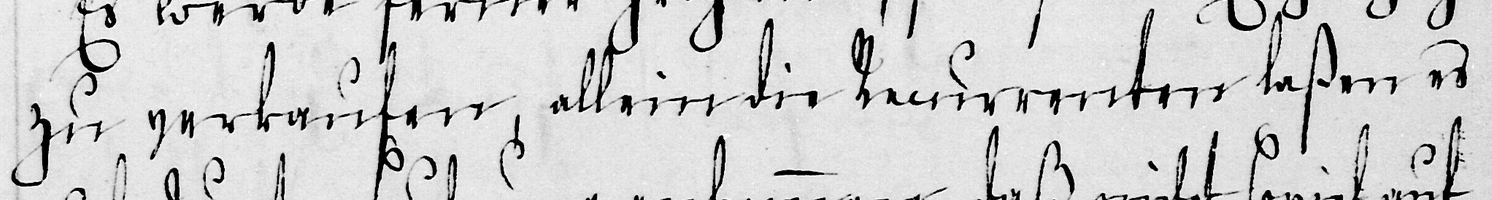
zu verkaufen, allein die Recurrenten laßen es
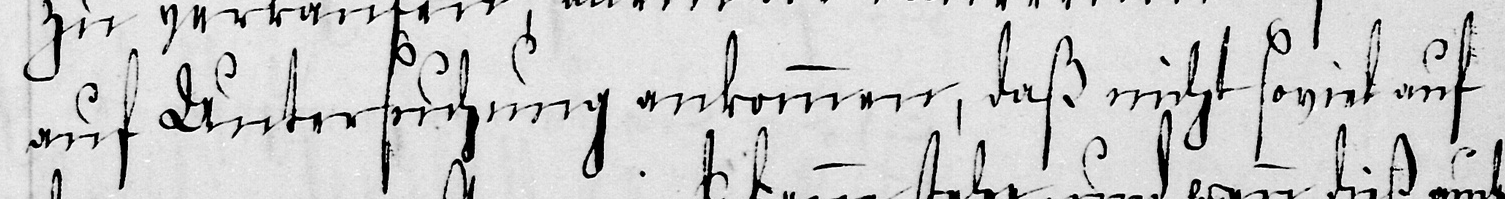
auf Untersuchung ankommen, daß nicht soviel auf
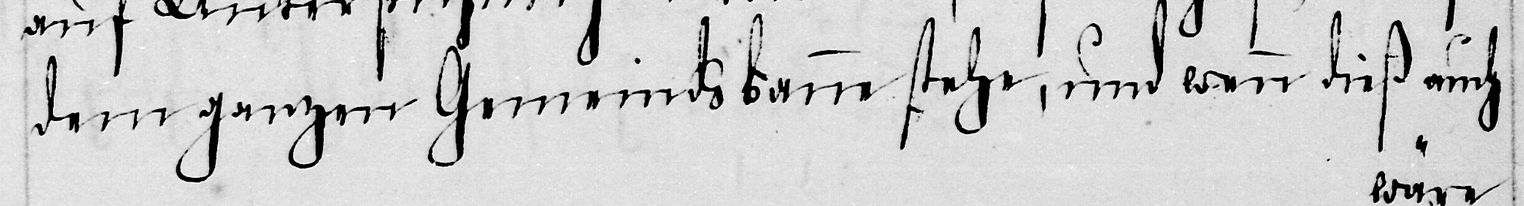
dem ganzen Gemeindsbanne stehe, und wenn dieß auch
